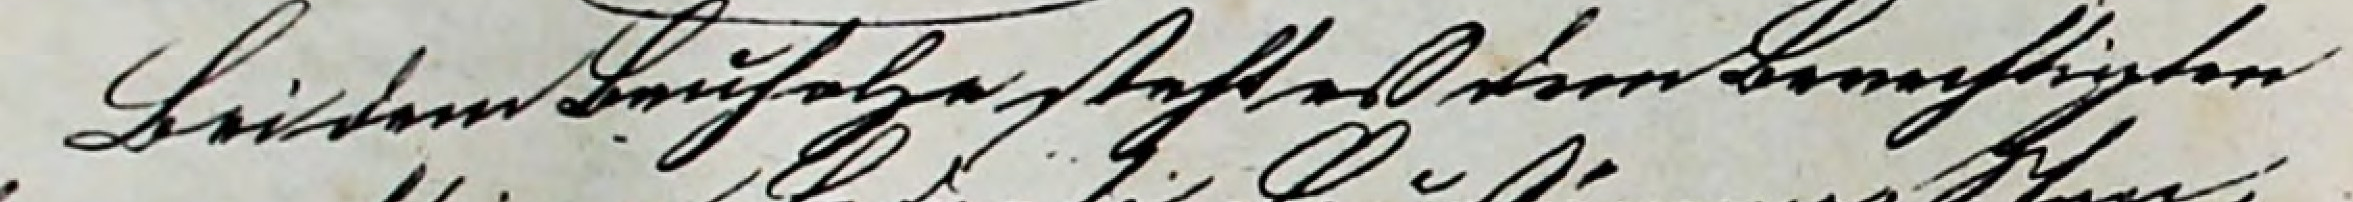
Bei dem Bauholze steht es Berechtigten
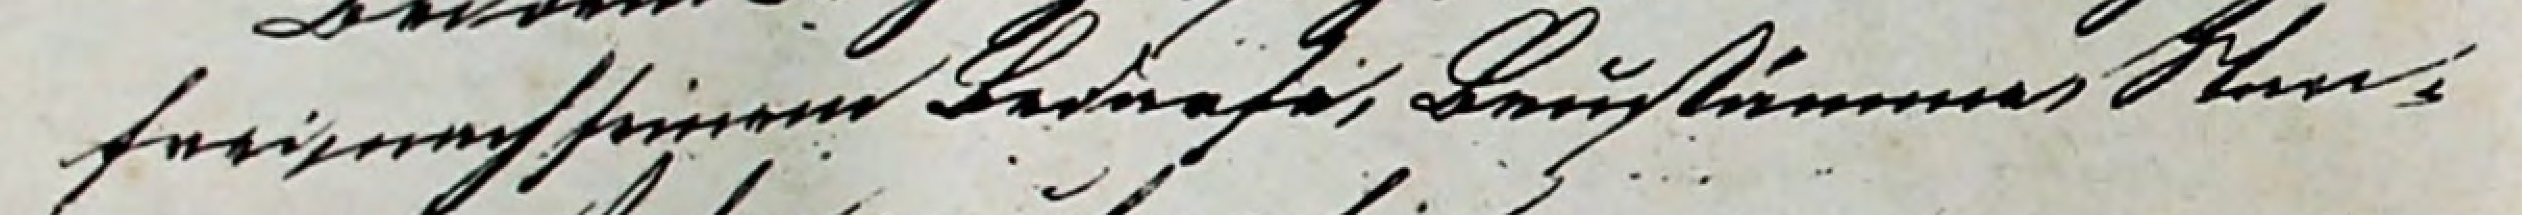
frei mach seinem Bedarfe, Baustämme Stan„
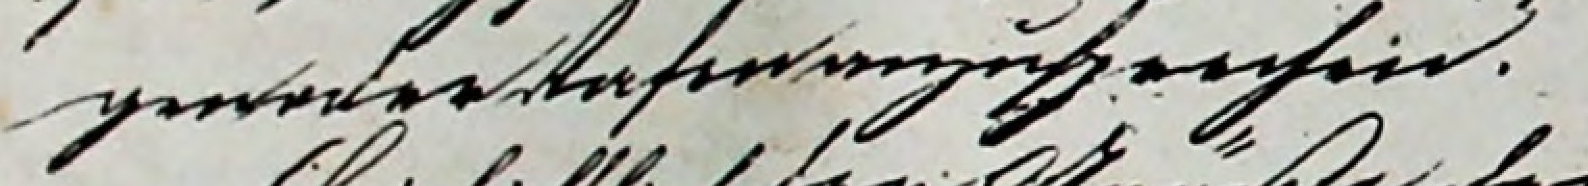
genener dafen angusgrechen.
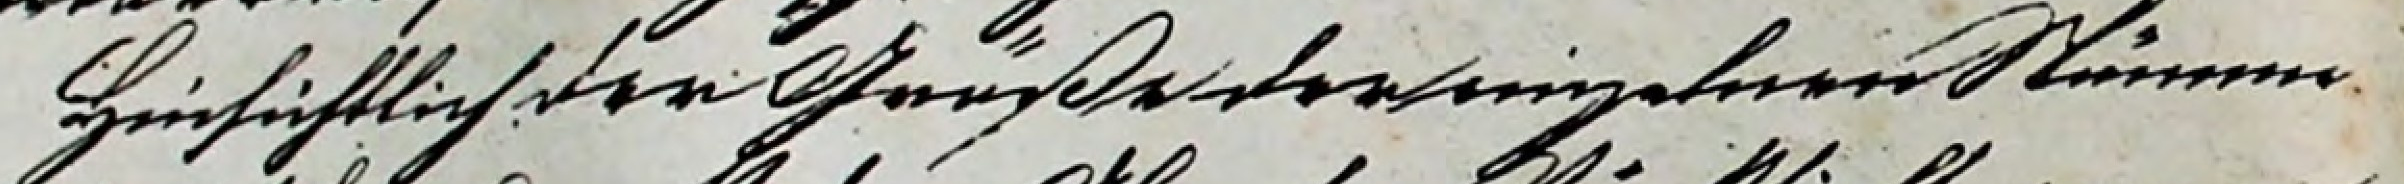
Hinfühtlich der Größe der einzelnen Stumme
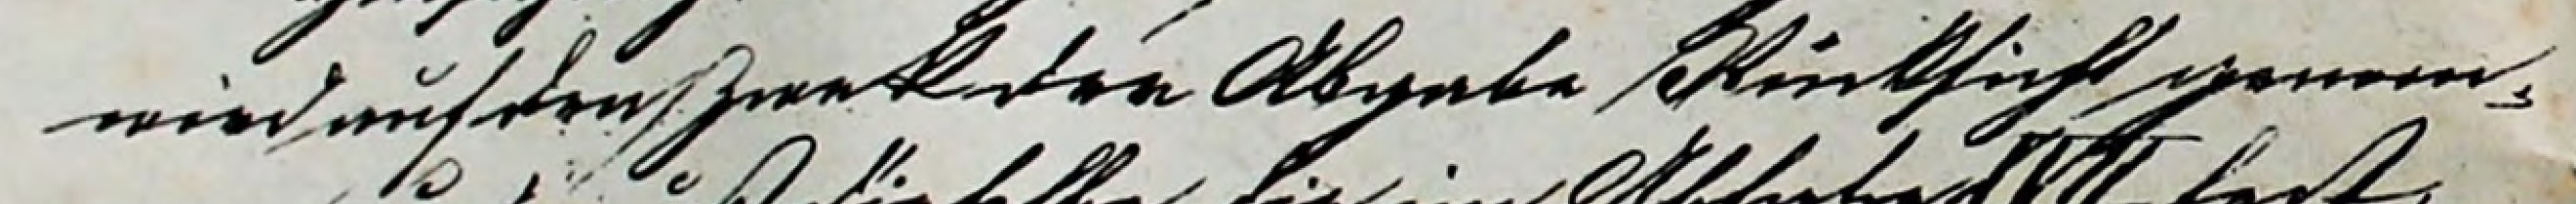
wird auf den Zwek der Abgabe Rücksicht genene„
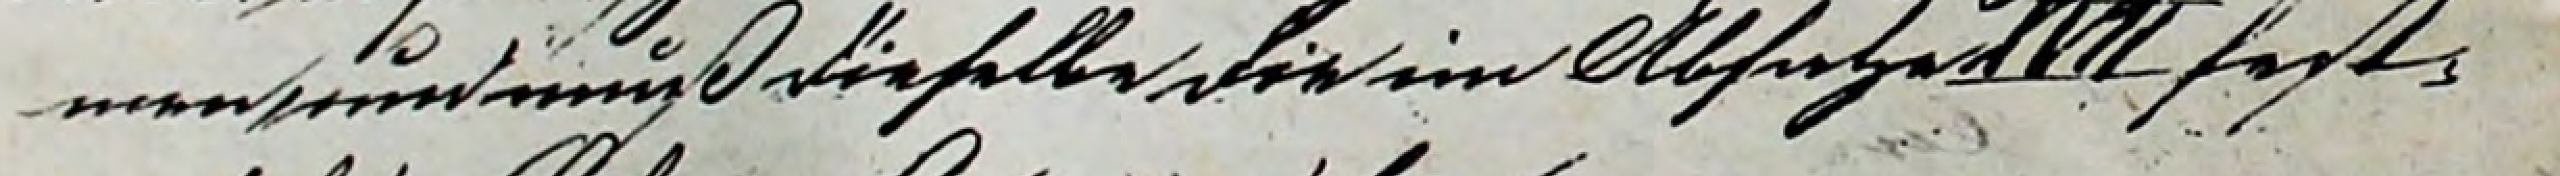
men und muß dieselbe die im Absatze XVII fest„
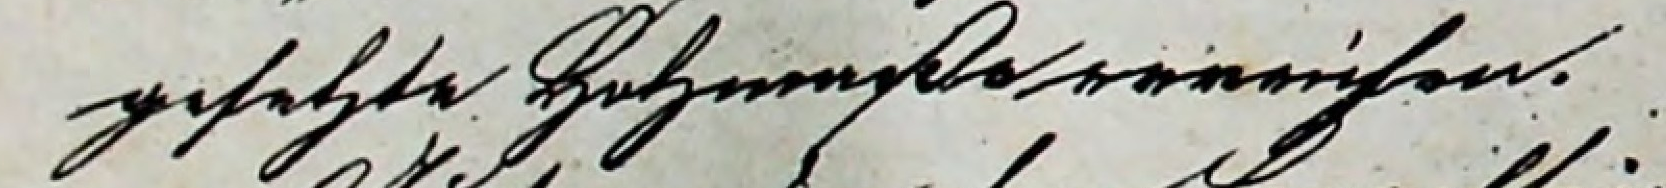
gesetzte Holzmaße erreichen.
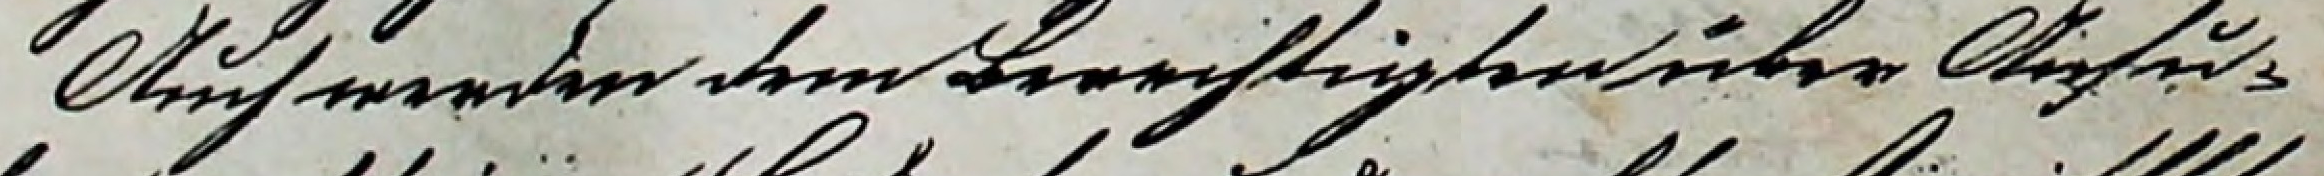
Auch werden dem Berechtigten über Ansu„
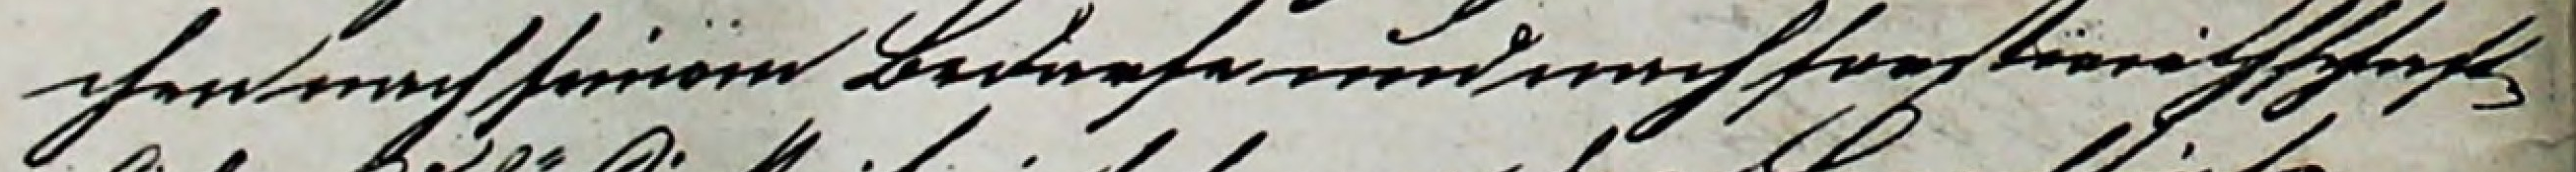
chen nach seinem Bedarfe und nach forstwirthschaft„
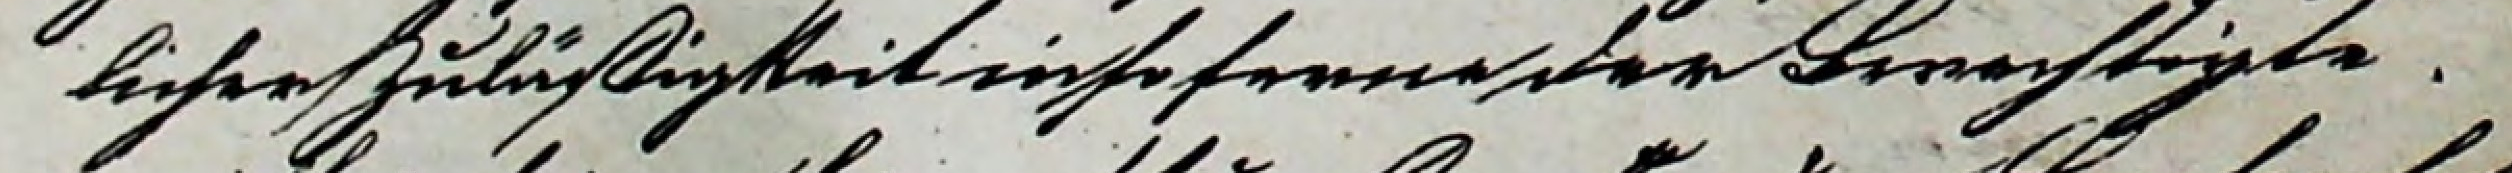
licher Zuläßigkeit in so ferne der Berechtigte.
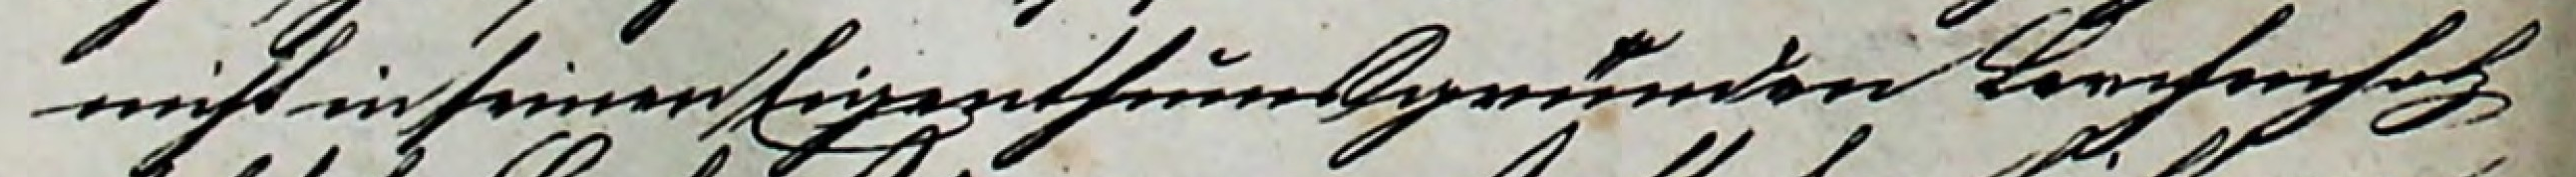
nicht in seinen Eigentghumsgründen Lerchenholz
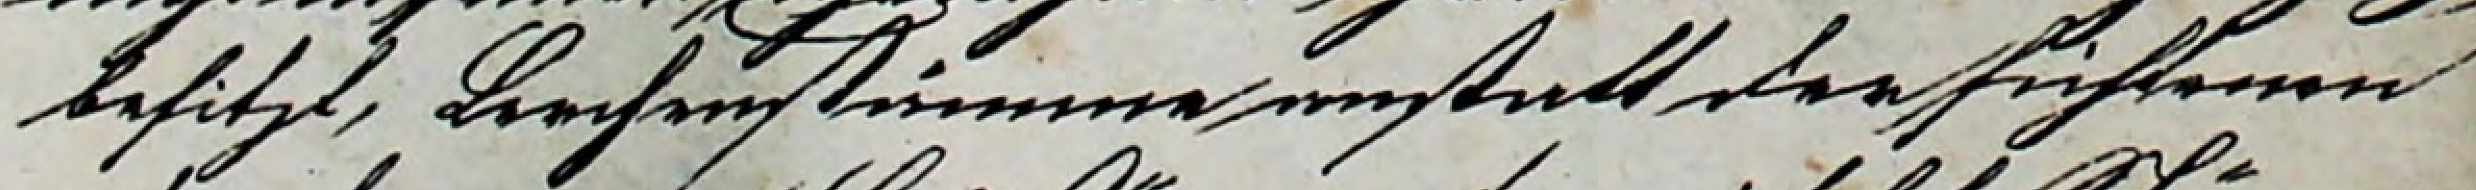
besitzt, Lerchenstämme anstatt der fichtenen
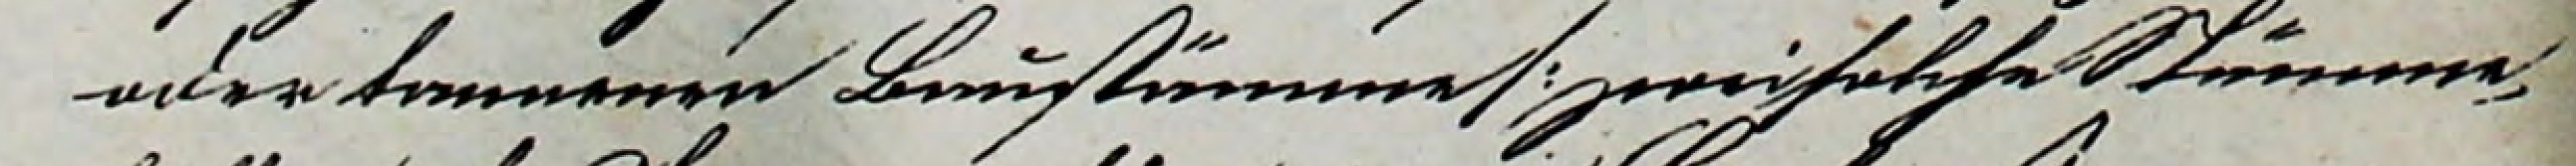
oder Sannenen Baustämme /:zweihohhe Stämme,
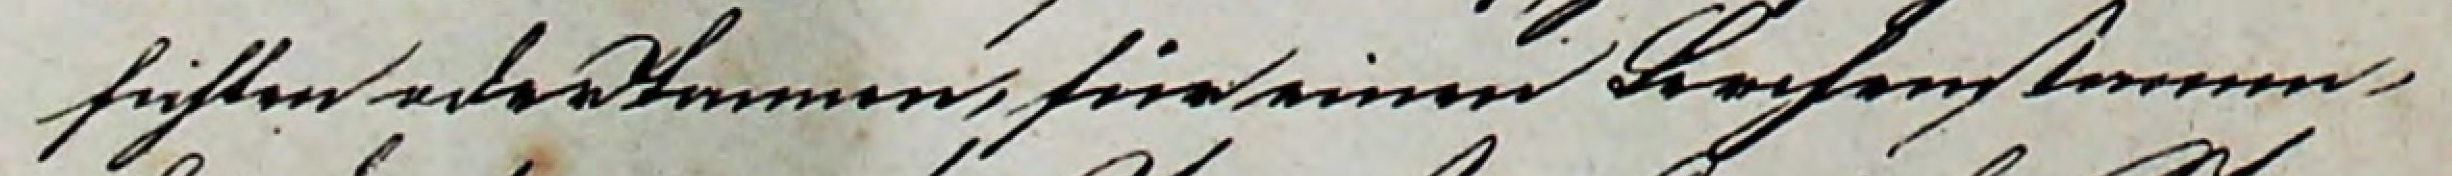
fichten oder Tannen, für einen Lerchenstamen,
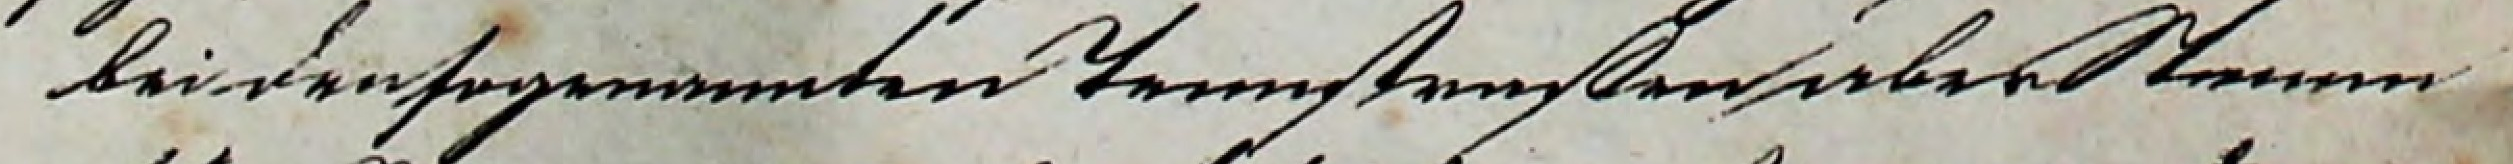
bei den sogenannten Tenntraßen aber Stamm
